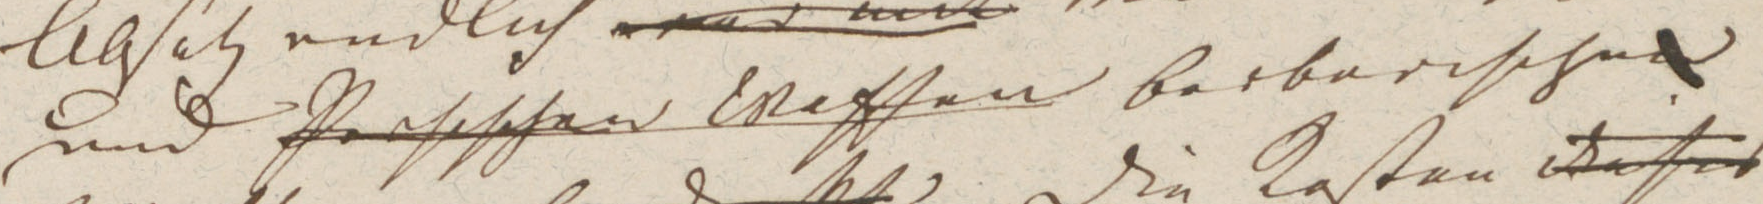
und Persischen Waffen barbarischen
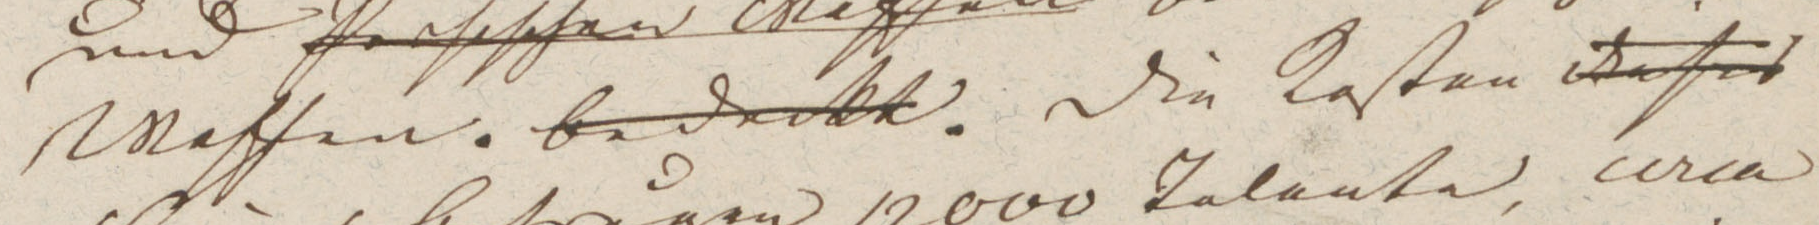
Waffen. bedeckt. Die Kosten dieses
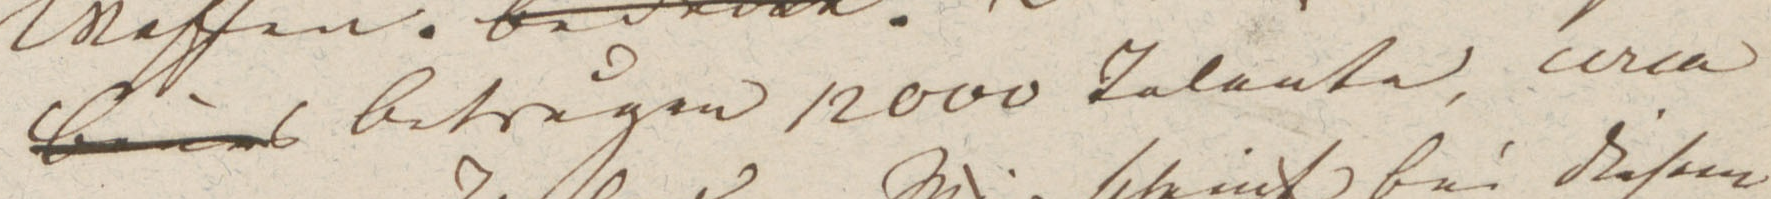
Baues betrugen 12000 Talente, circa
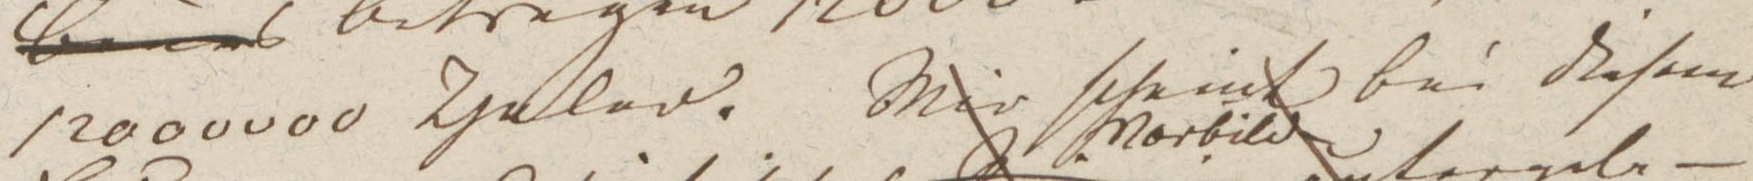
12000000 Thaler. Mir scheint bei diesem
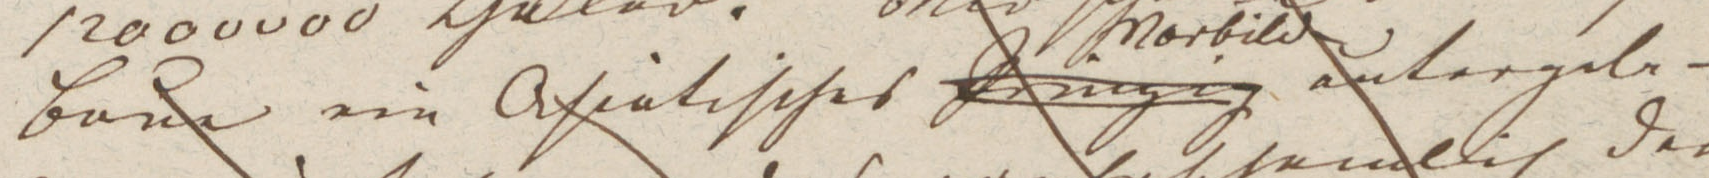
Baue ein Asiatisches Prinzip Vorbilde untergele-
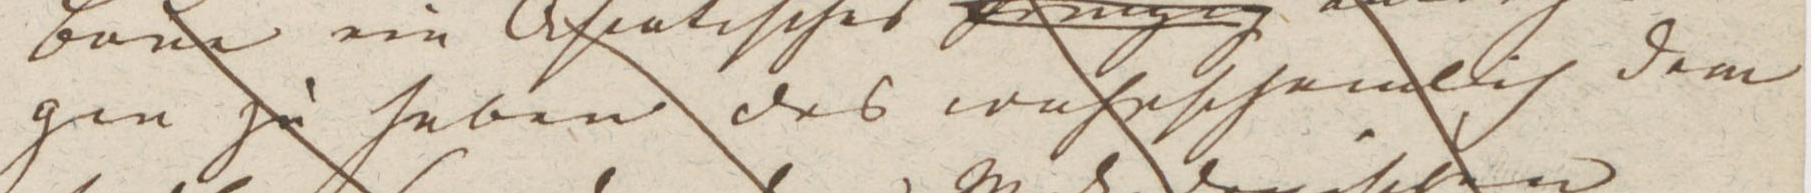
gen zu haben das wahrscheinlich dem
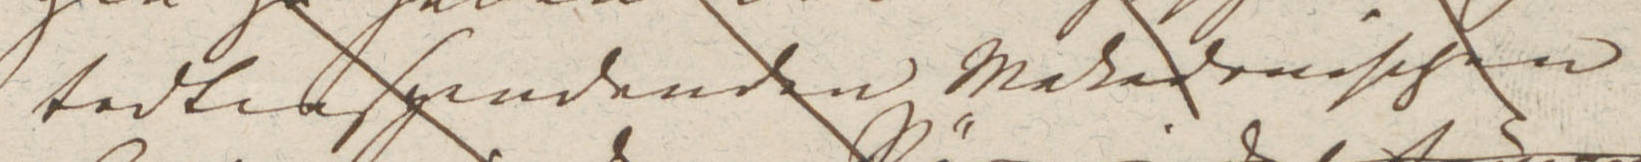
todtenspendenden Makedonischen
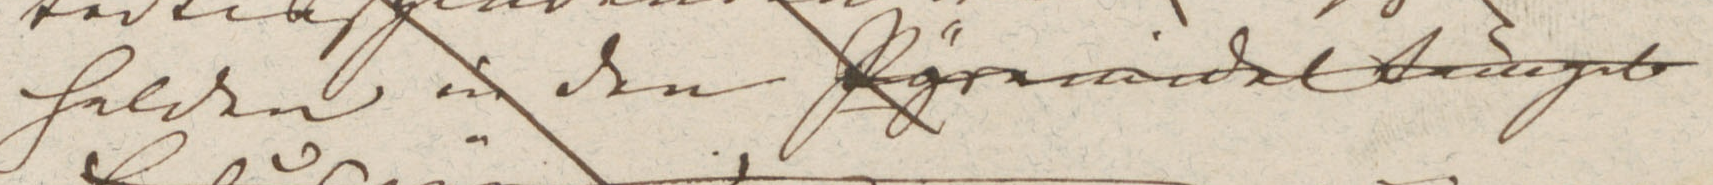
Helden in den Pyramiadaltempel
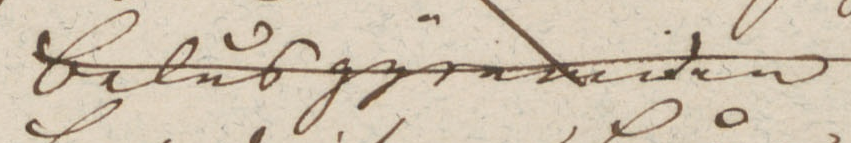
Beluspyramiden
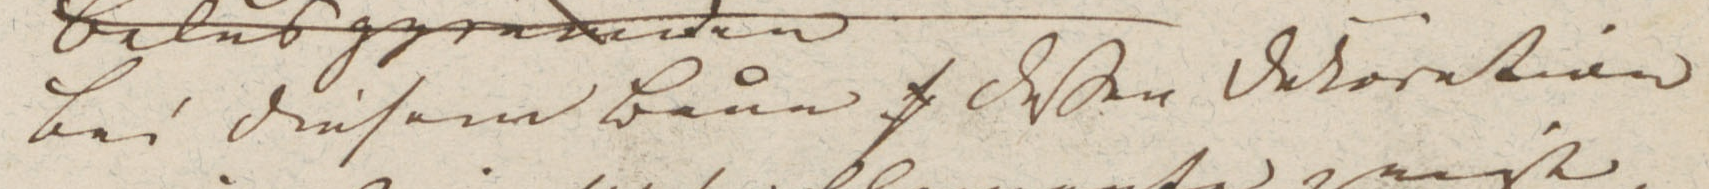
Bei diesem Baue s dessen Dekoration
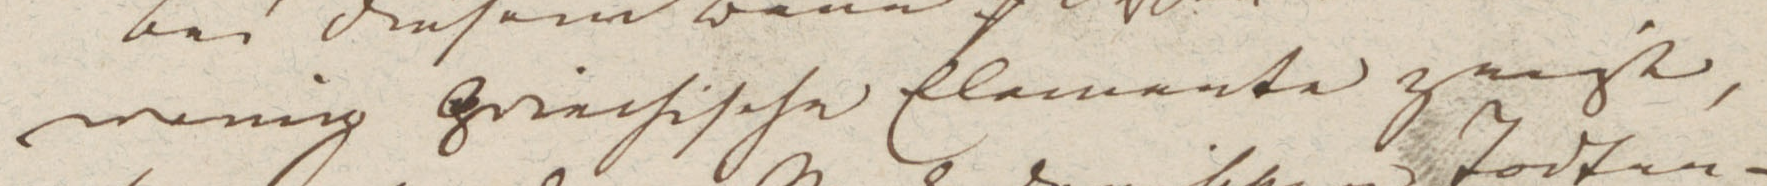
wenig gGriechische Elemente zeigt,
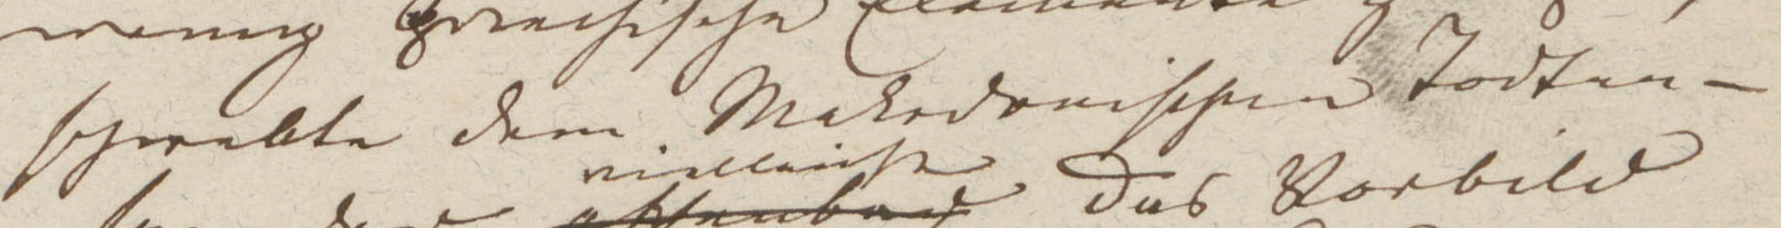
schwebte dem Makedonischen Todten-
